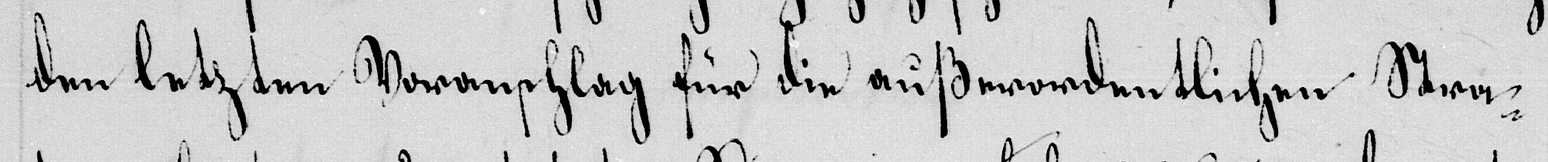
den letzten Voranschlag für die außerordentlichen Stra¬
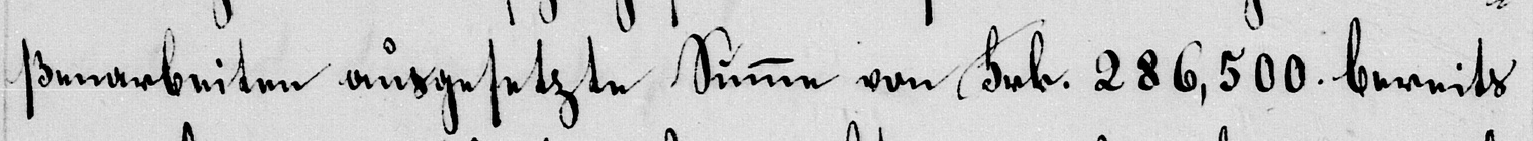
ßenarbeiten ausgesetzte Summe von Frk. 286,500. bereits
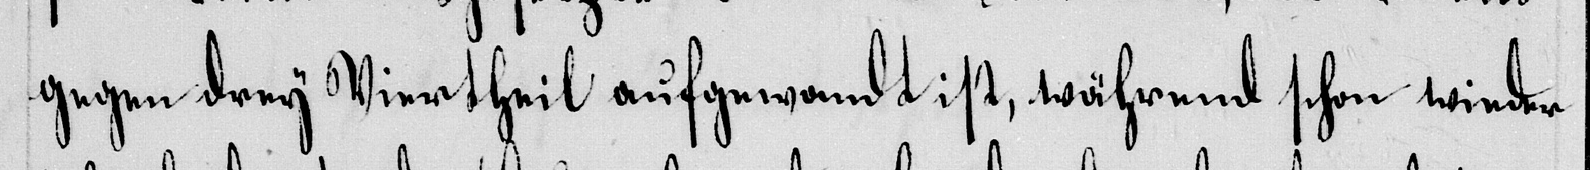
gegen drey Viertheil aufgewandt ist, während schon wieder
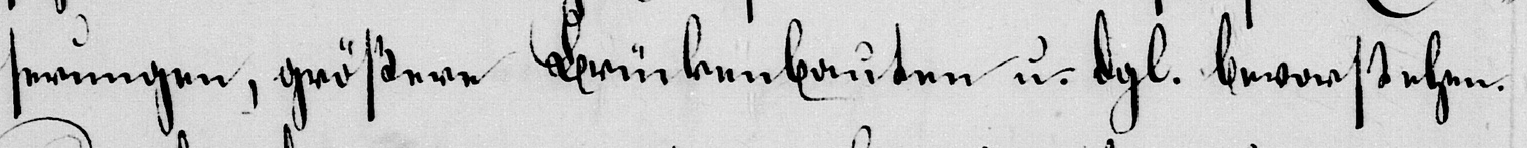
erungen, größere Brückenbauten u. dgl. bevorstehen.
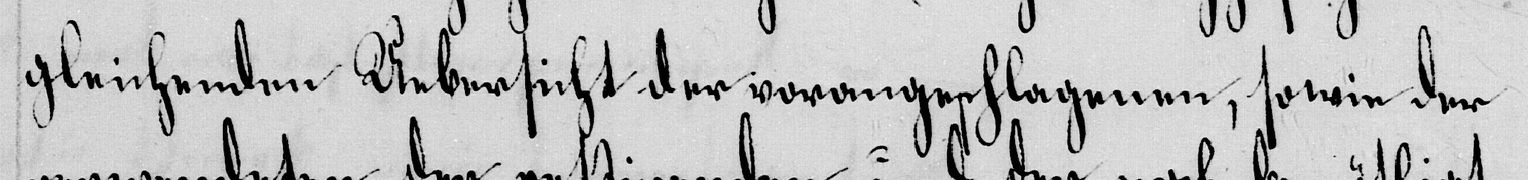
gleichenden Uebersicht der vorangeschlagenen, sowie der
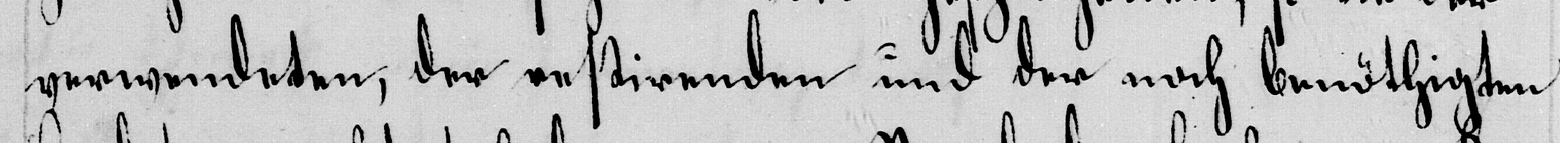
verwendeten, der restirenden und der noch benöthigten
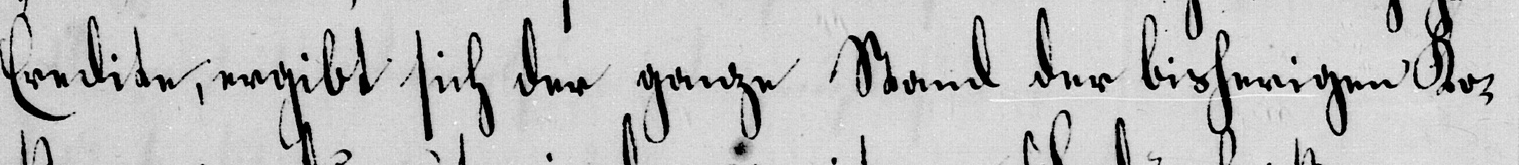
Credite, ergibt sich der ganze Stand der bisherigen Ko¬
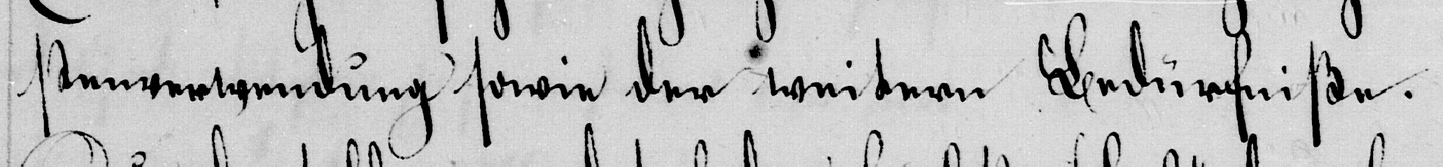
stenverwendung sowie der weitern Bedürfniße.
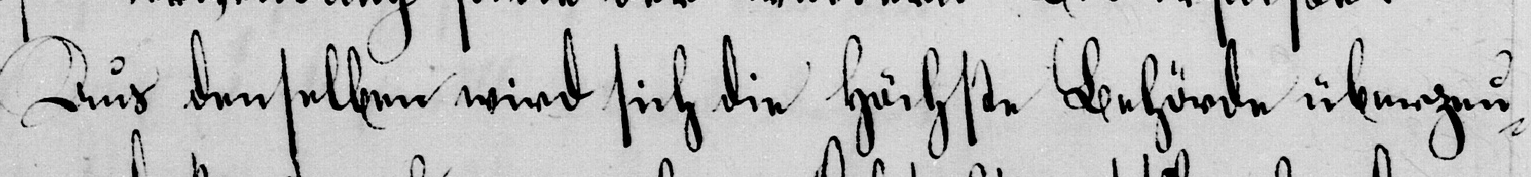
Aus denselben wird sich die Höchste Behörde überzeu¬
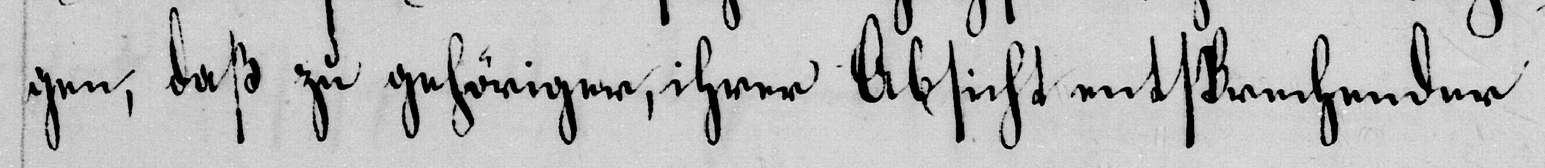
gen, daß zu gehöriger, ihrer Absicht entsprechender
